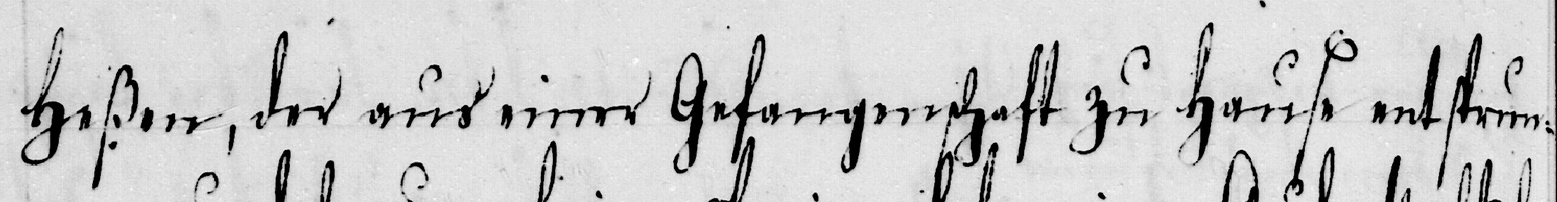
Heßen, der aus einer Gefangenschaft zu Hause entsprun¬
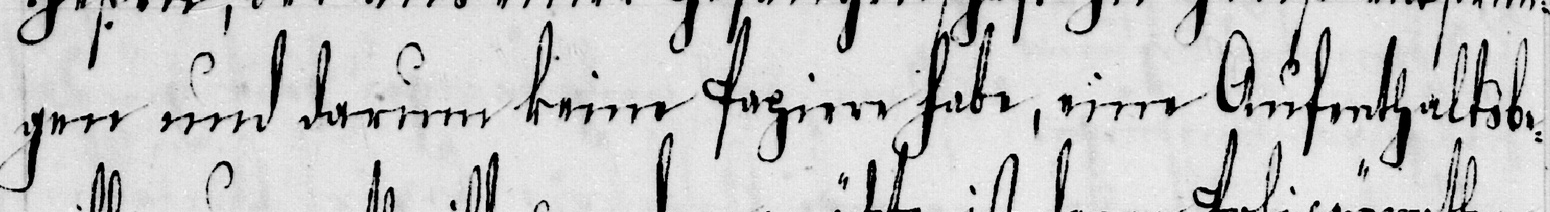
gen und darum keine Papiere habe, eine Aufenthaltsb¬
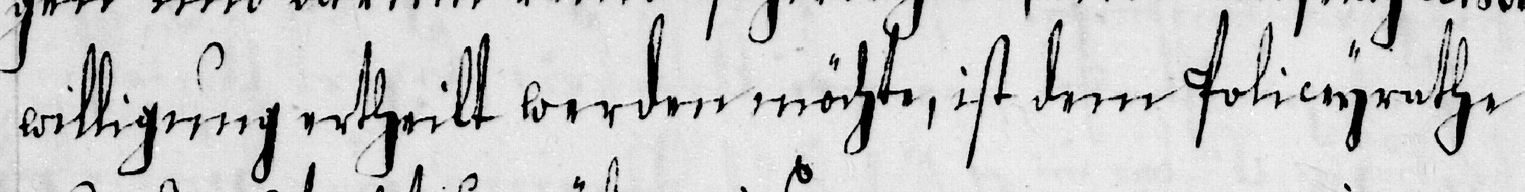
willigung ertheilt werden möchte, ist dem Policeyrathe
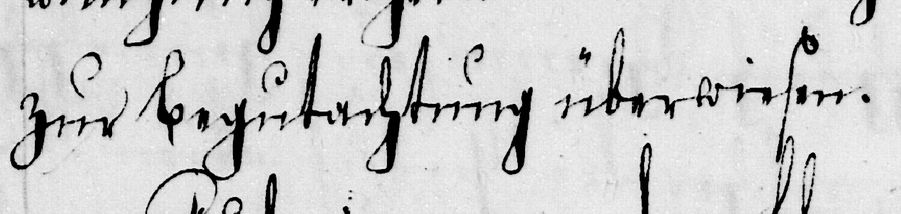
zur Begutachtung überwiesen.
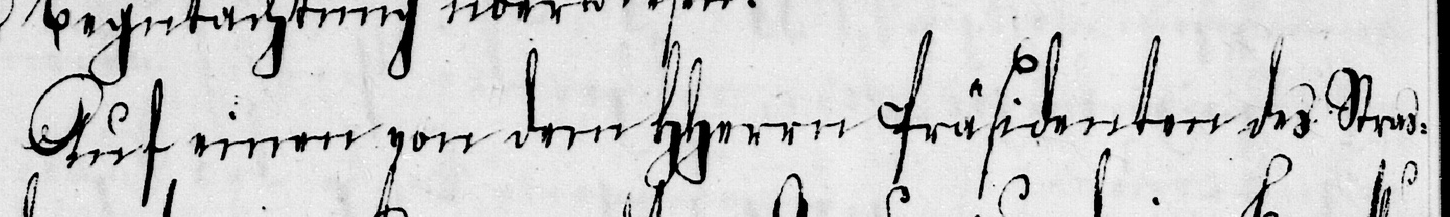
Auf einen von dem HHerrn Präsidenten des Stra¬
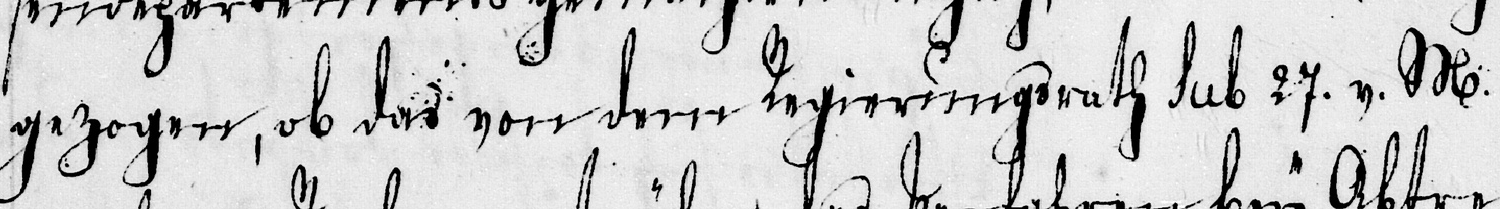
gezogen, ob das von dem Regierungsrath sub 27. v. M.
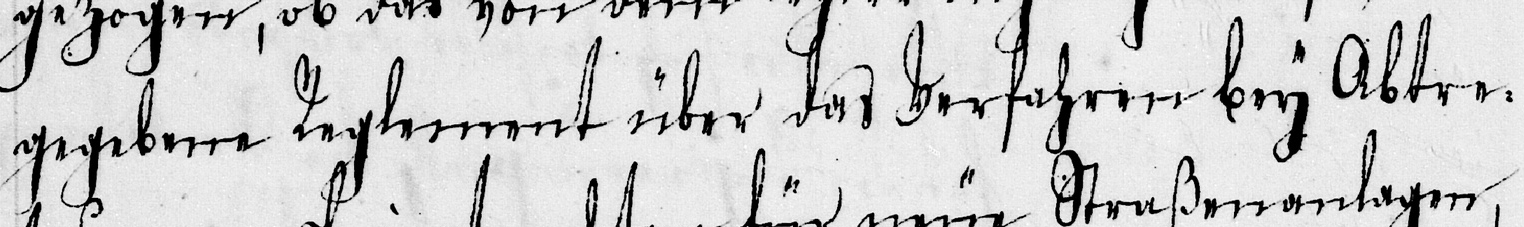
gegebene Reglement über das Verfahren bey Abtre¬
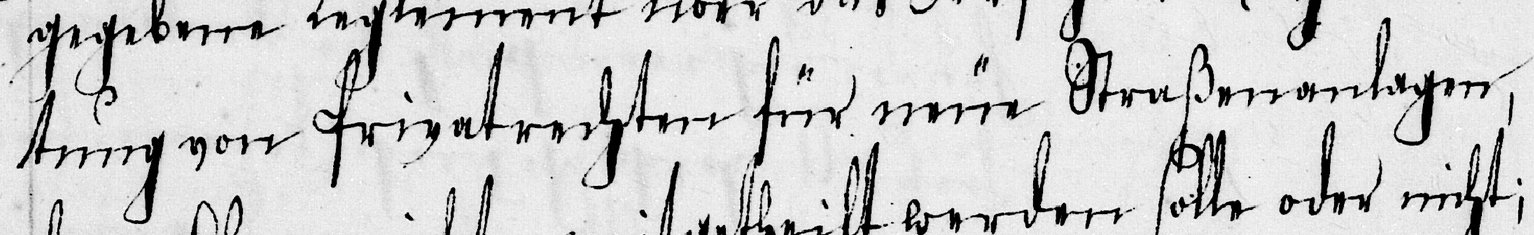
tung von Privatrechten für neue Straßenanlagen,
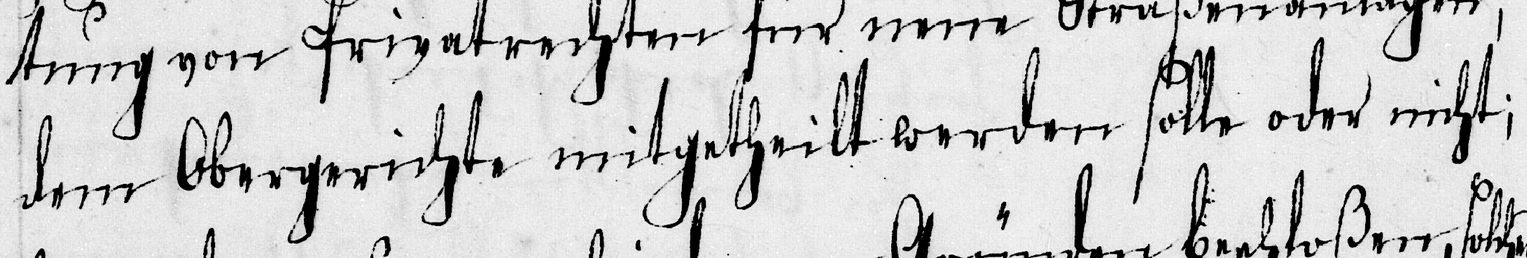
dem Obergerichte mitgetheilt werden solle oder nicht;
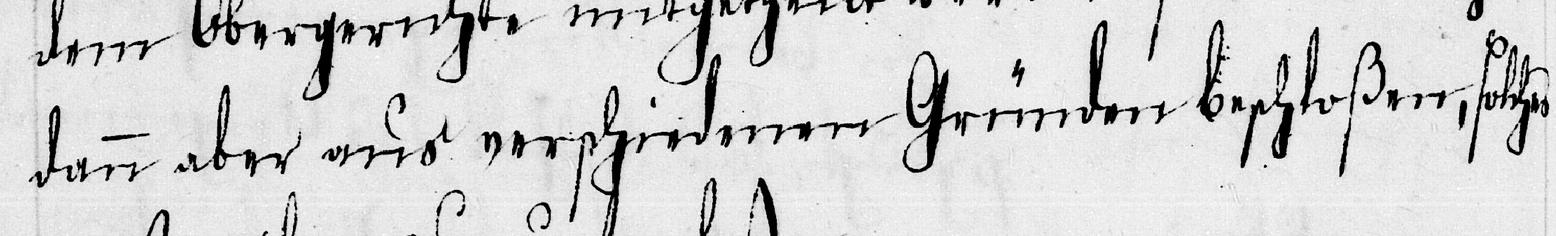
dann aber aus verschiedenen Gründen beschloßen, solc¬
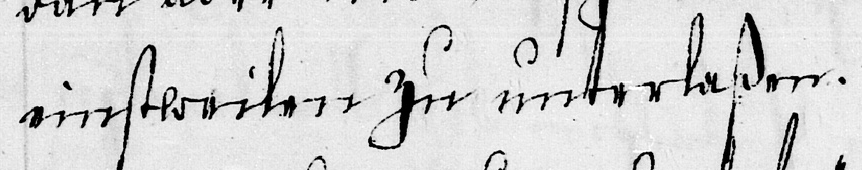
einstweilen zu unterlaßen.
